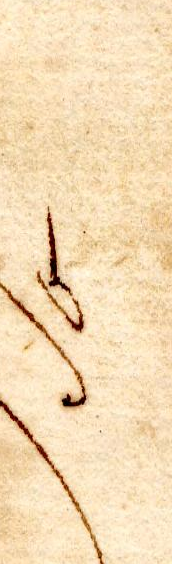To
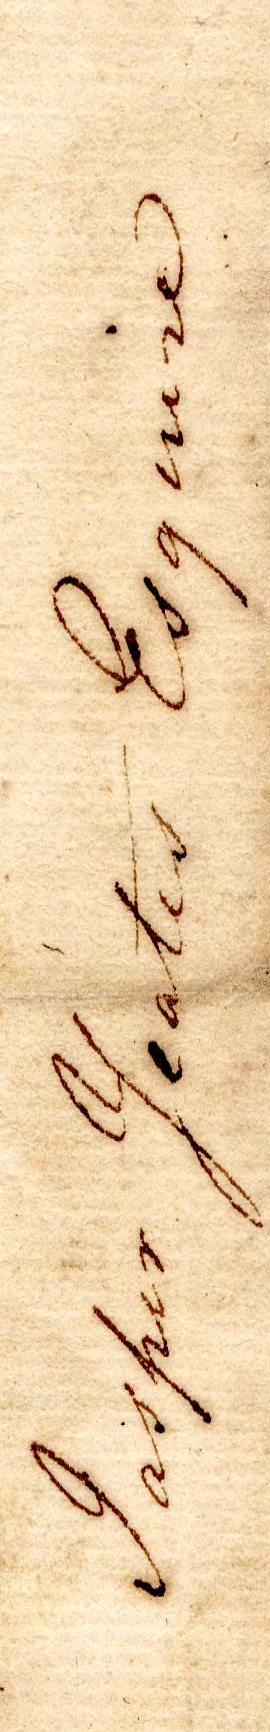Jasper Yeates Esquire
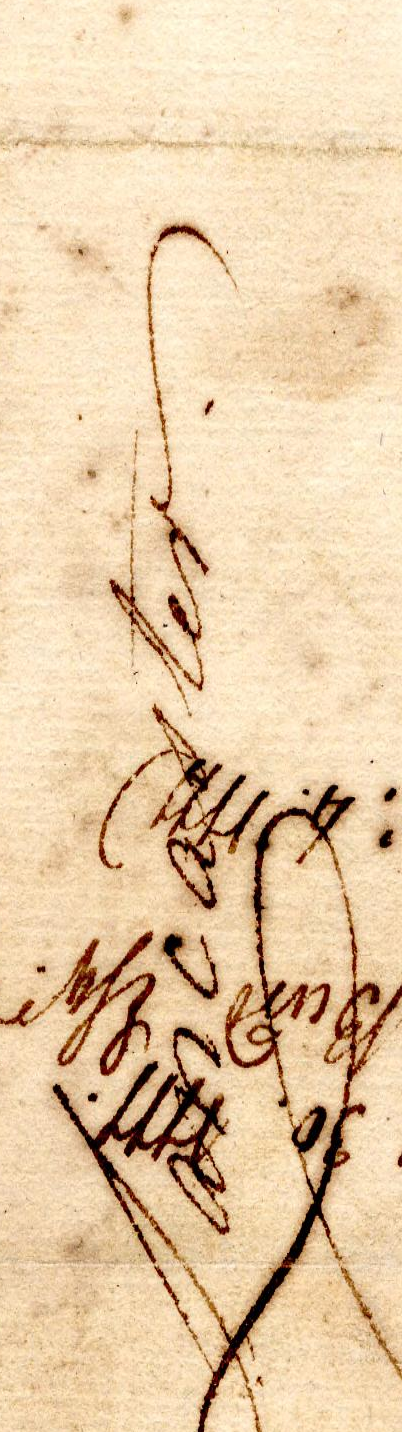Lancaster.
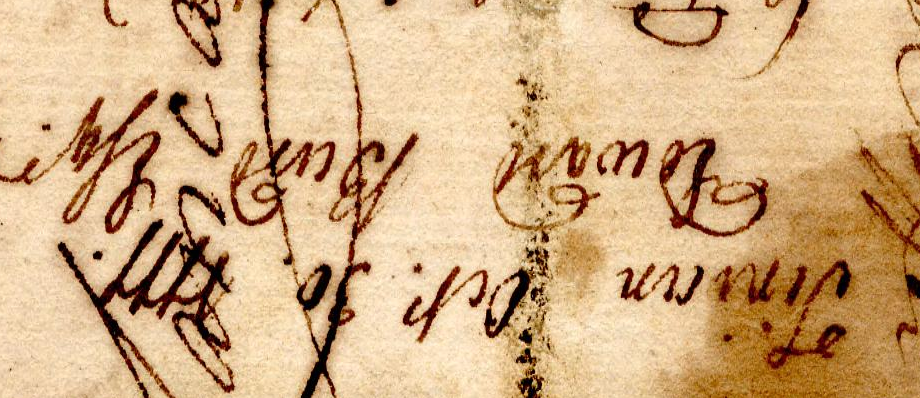Tinian Oct^r. 30. 1777.
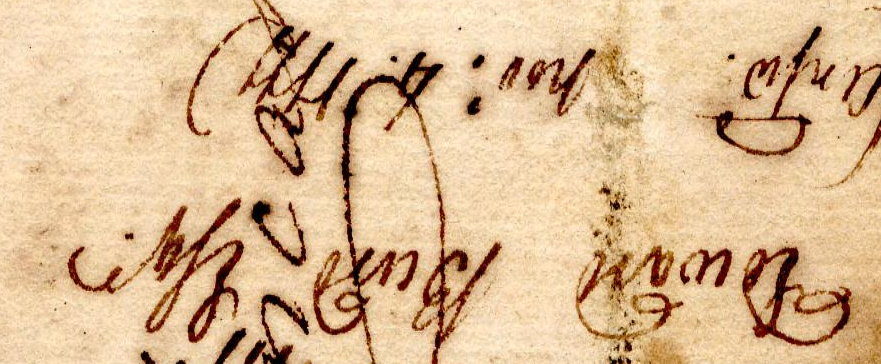Edward Burd Esq^r.
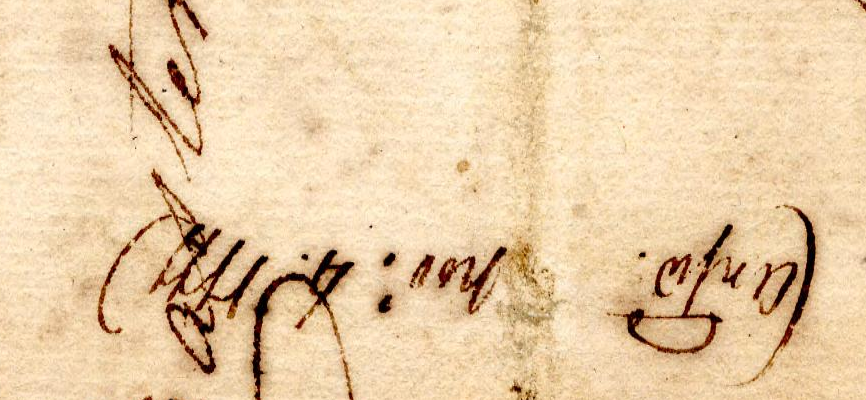(answ^d. Nov: 4. 1777)
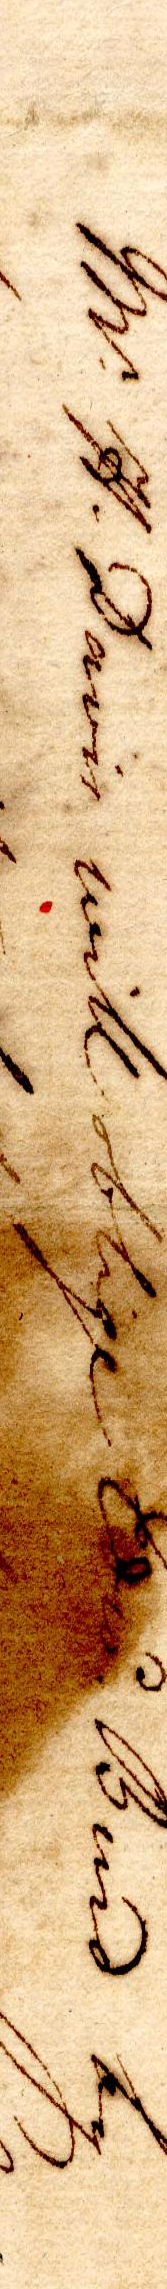M^r. H. Davis will oblge Edw^d. Burd by
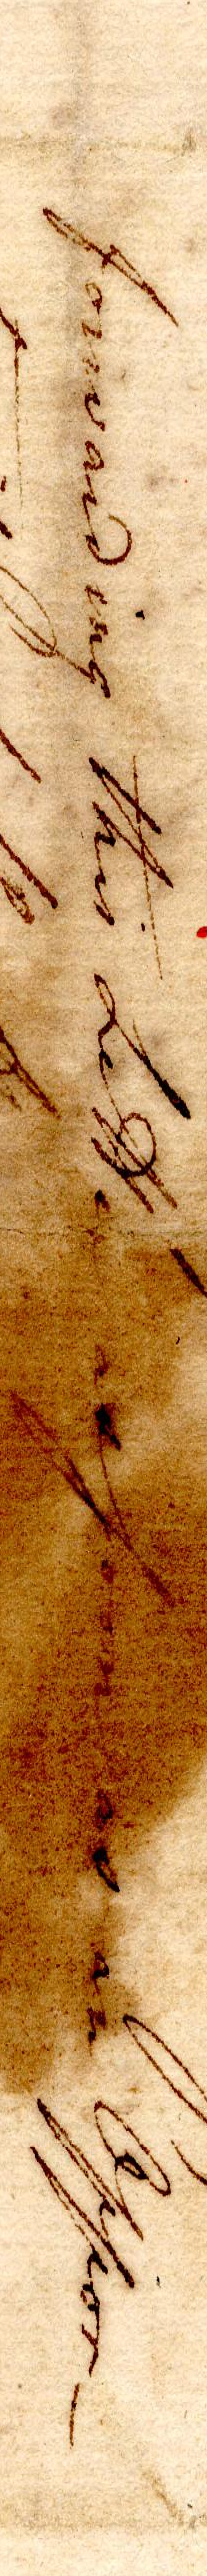forwarding this Letter as soon as an Oppor-
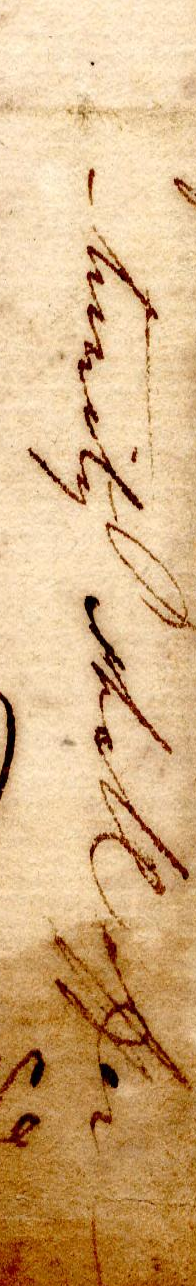-tunity shall offer
